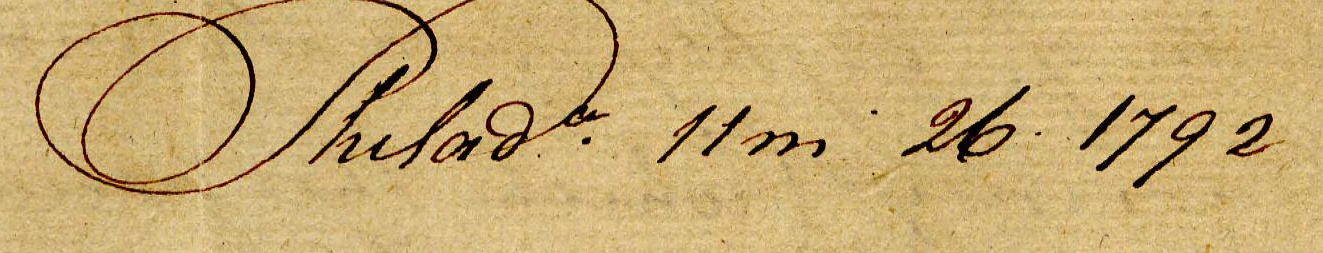Philad^a. 11m 26. 1792
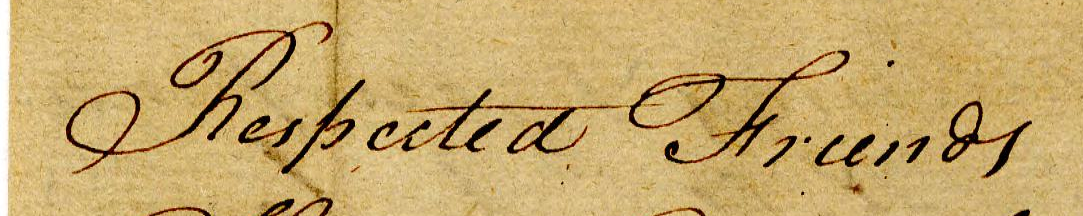Respected Friends
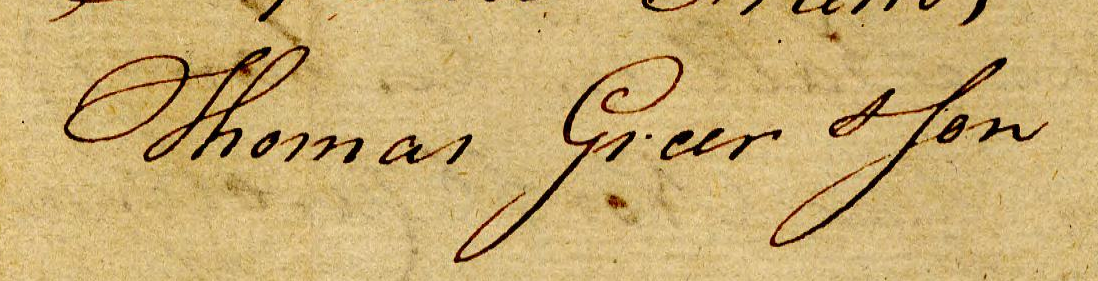Thomas Greer & Son
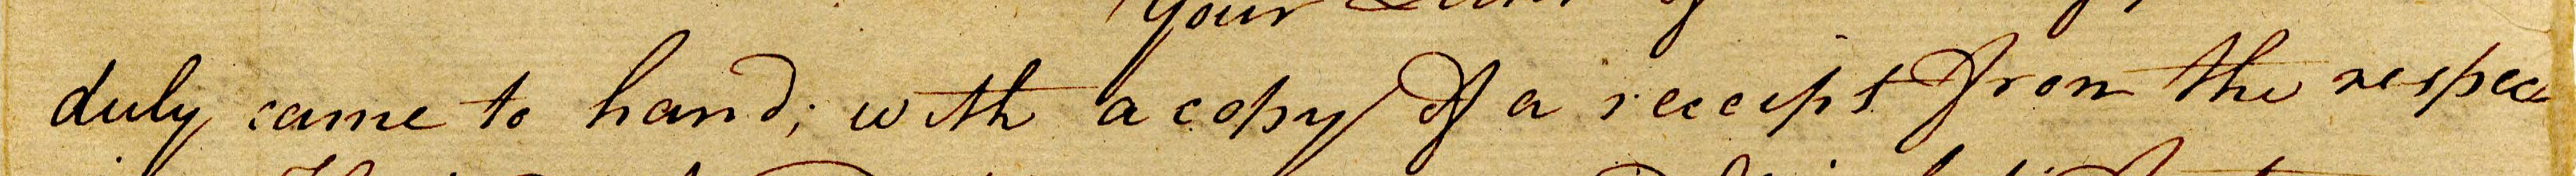duly came to hand; with a copy of a receipt from the respec
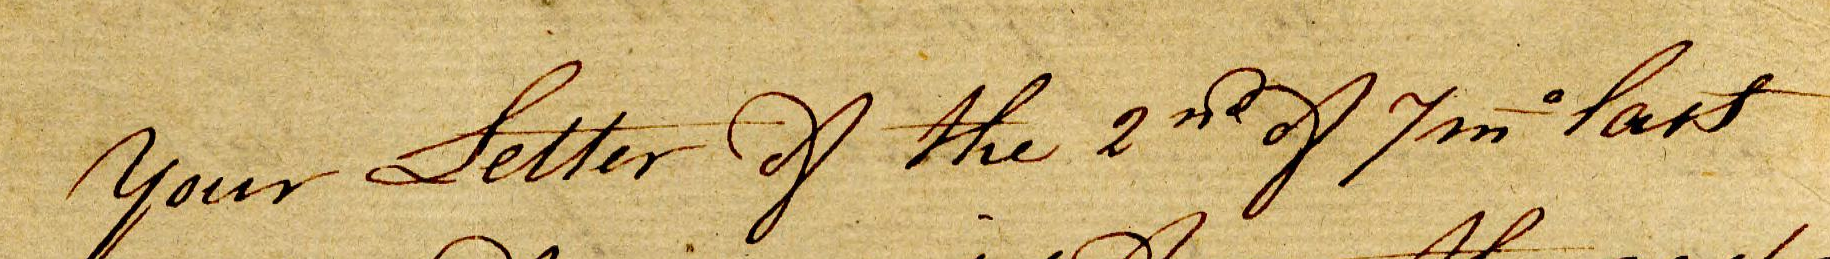your Letter of the 2^nd of 7m^o last
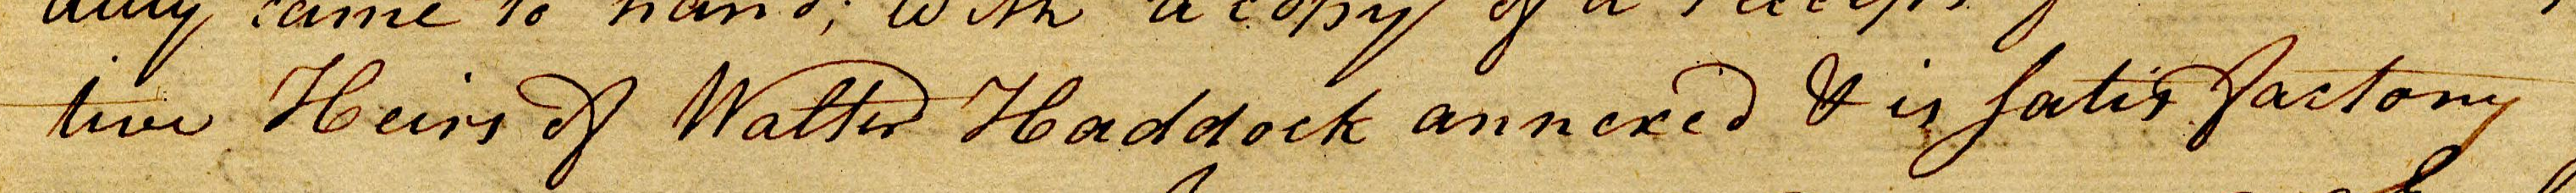tive Heirs Walter Haddock annexed & is satisfactory
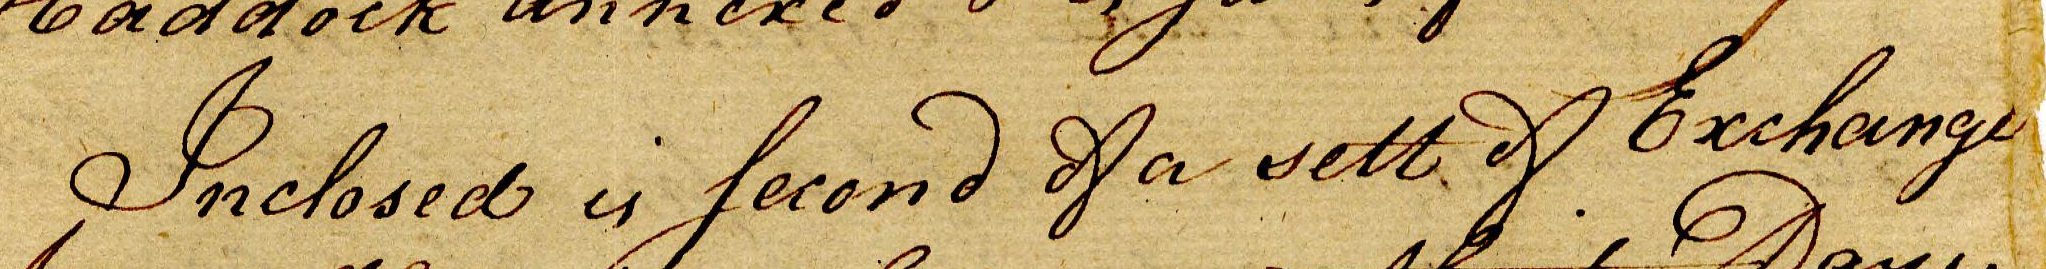Inclosed is second of a sett of Exchange
